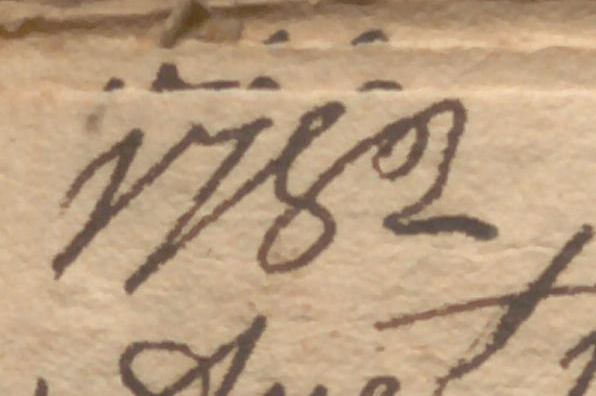1782
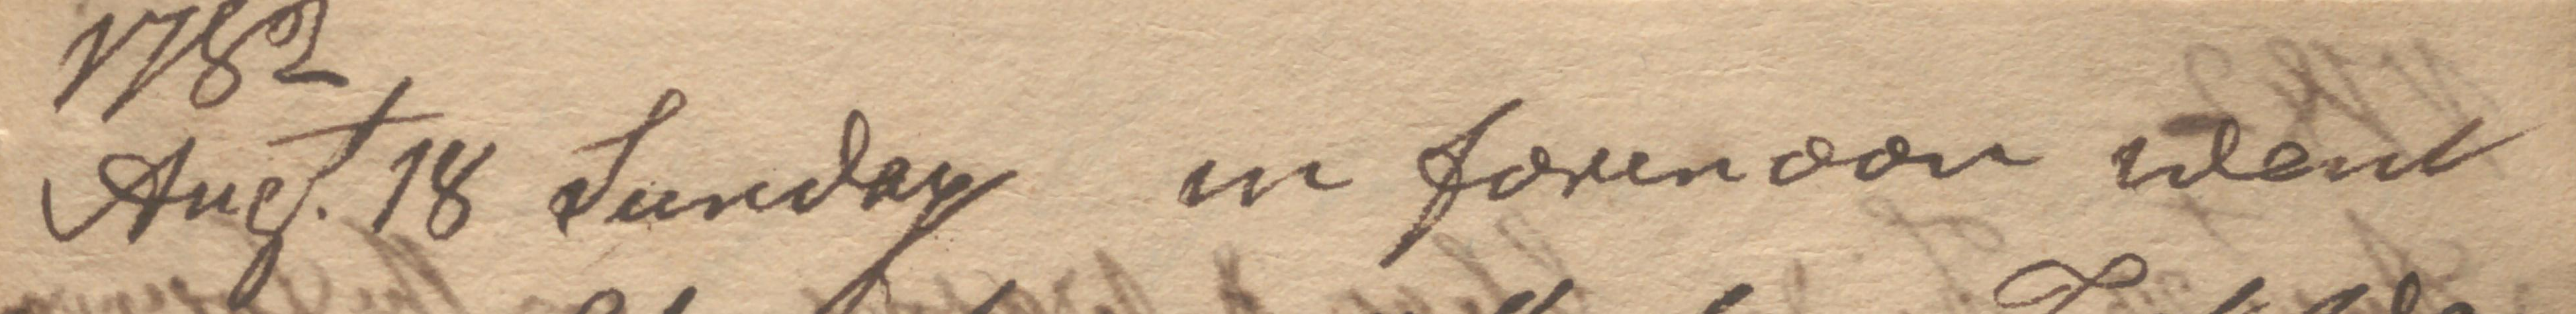Aug^t. 18 Sunday, in forenoon went
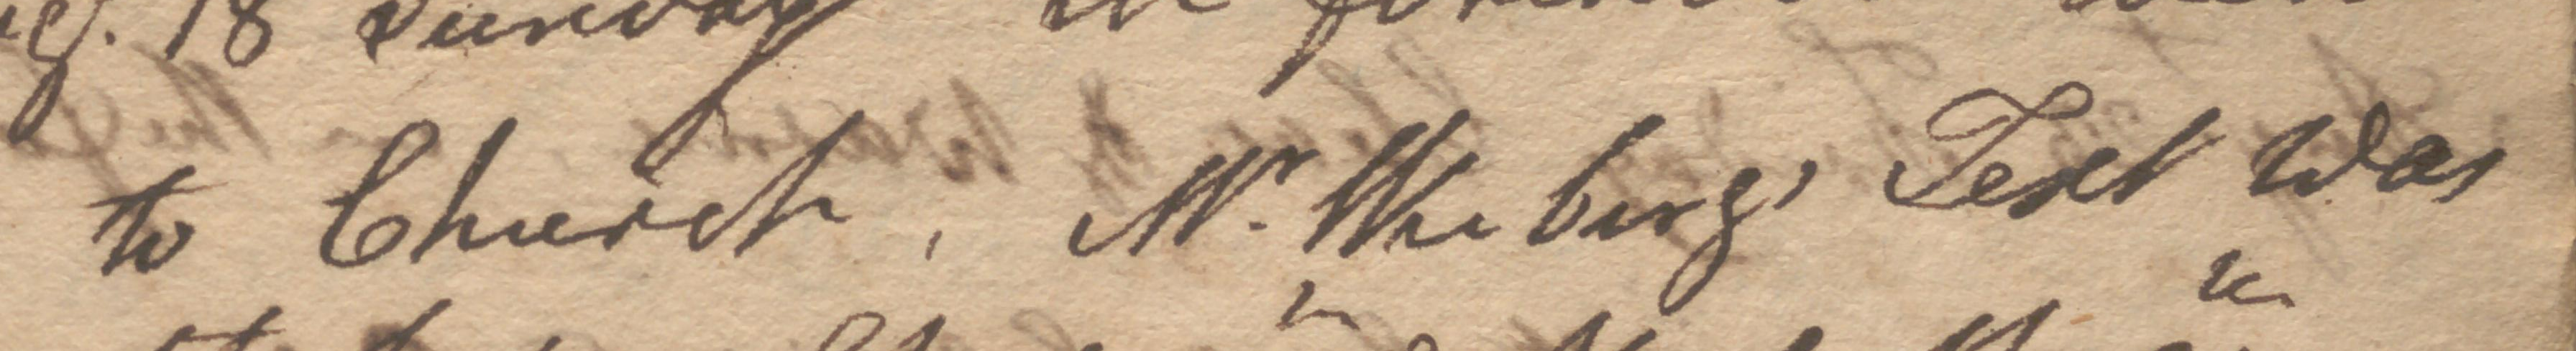to Church, M^r. Weibirgs Text Was
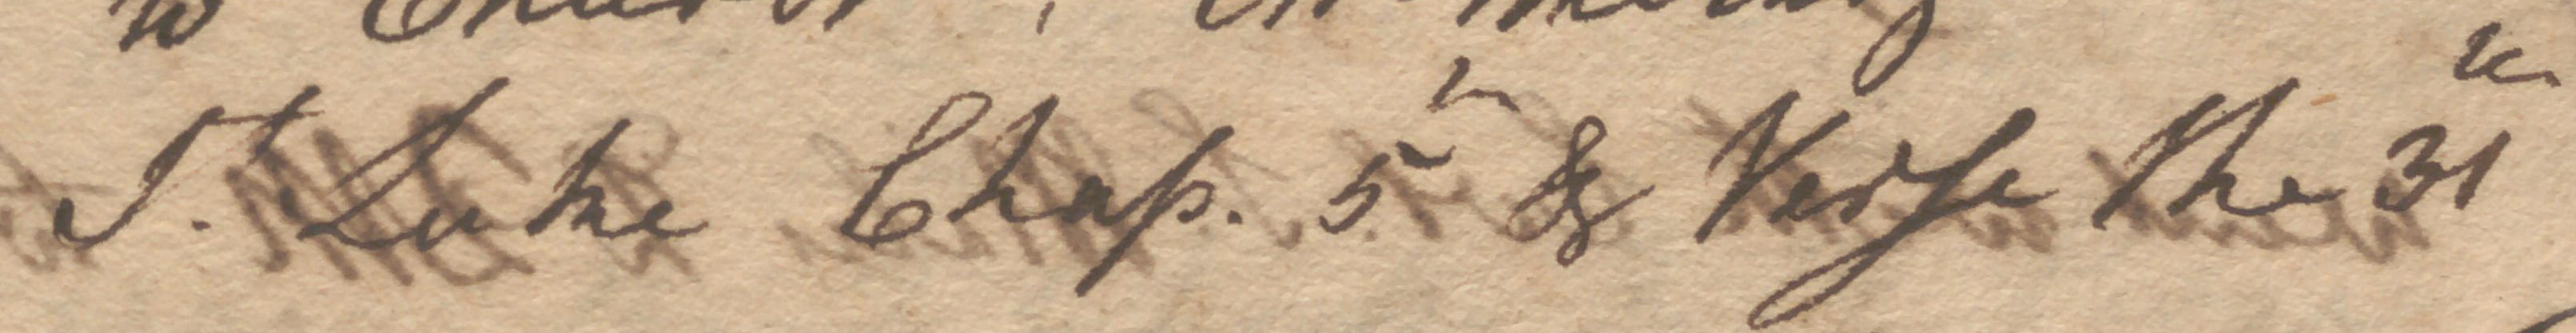S^t. Luke Chap. 5^th. & Verse the 31^th
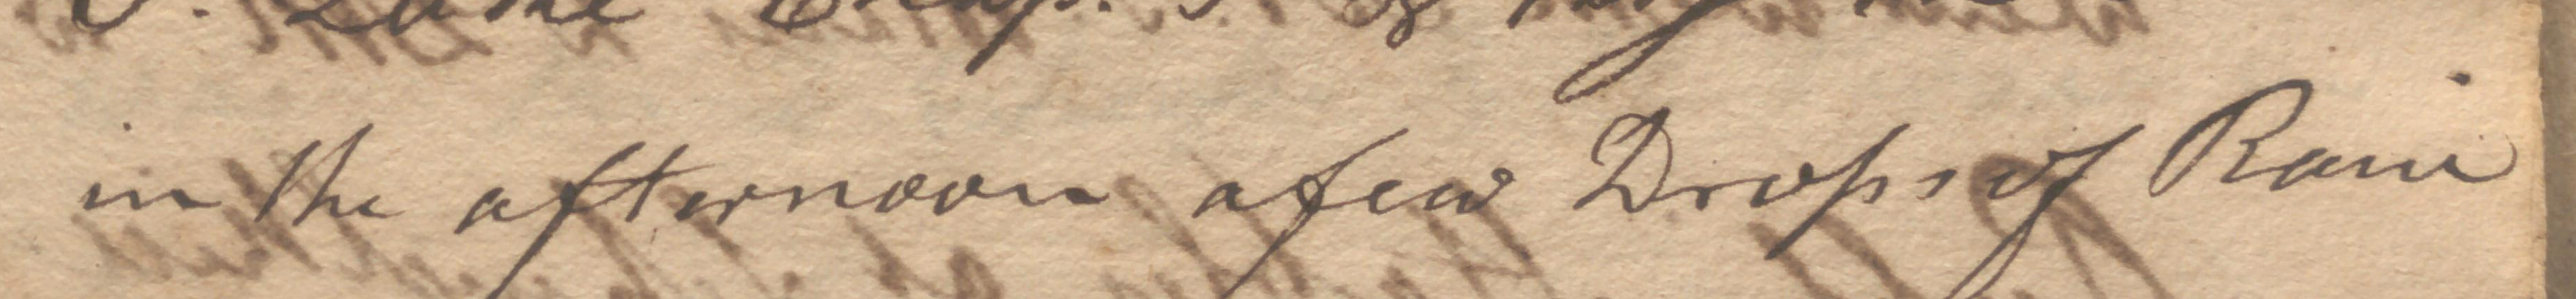in the afternoon a few Drops of Rain
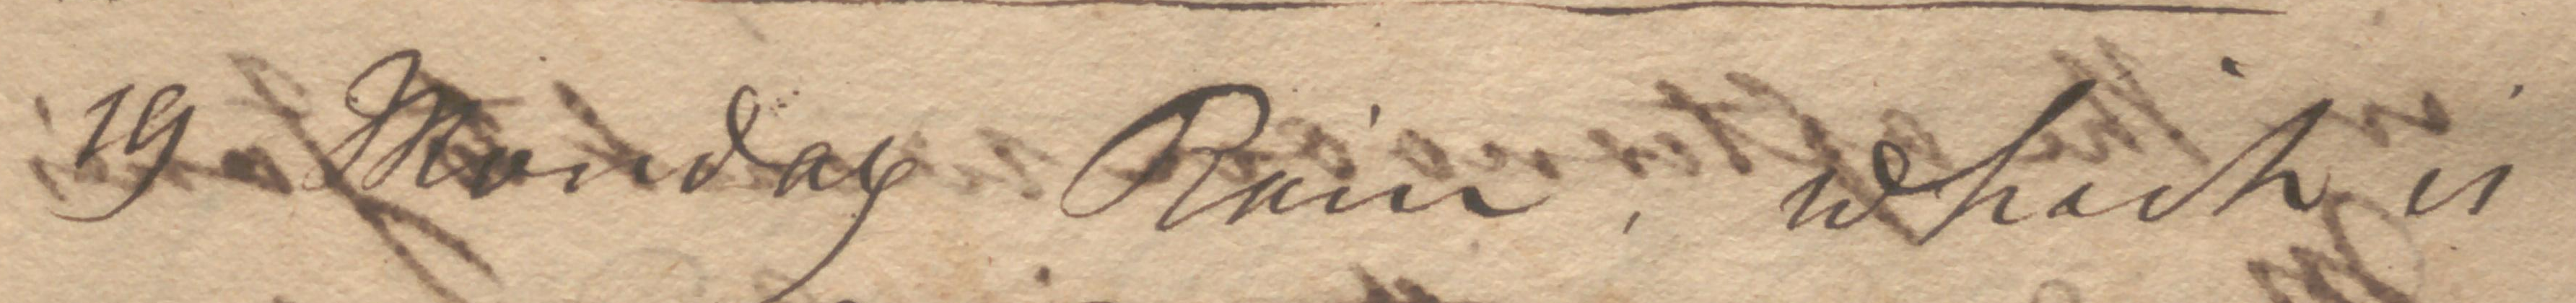19 Monday Rain, which is
